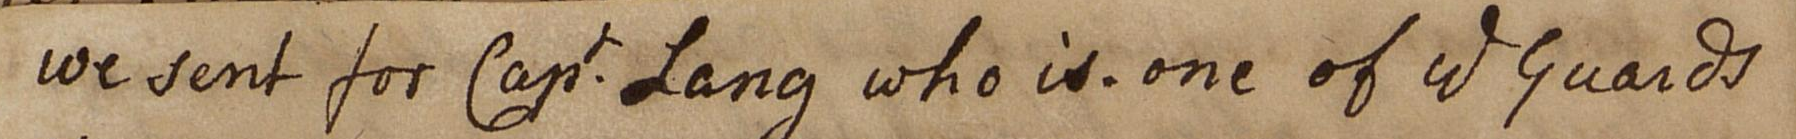we sent for Cap^t. Lang who is. one of y^e Guards
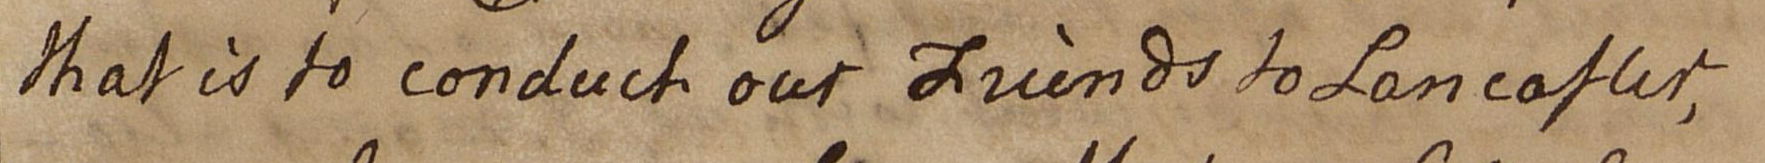that is to conduct our Friends to Lancaster,
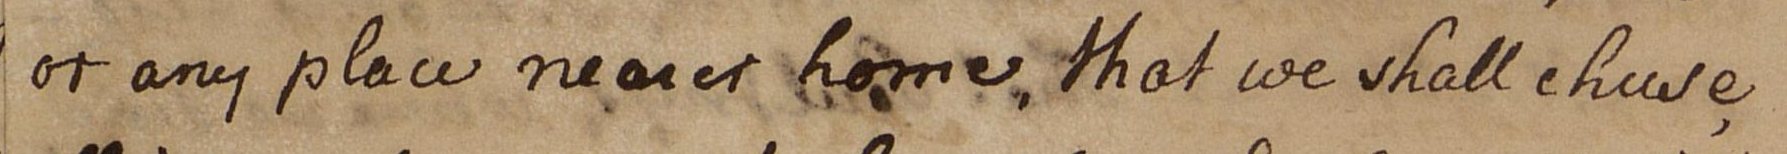or any place nearer home, that we shall chuse,
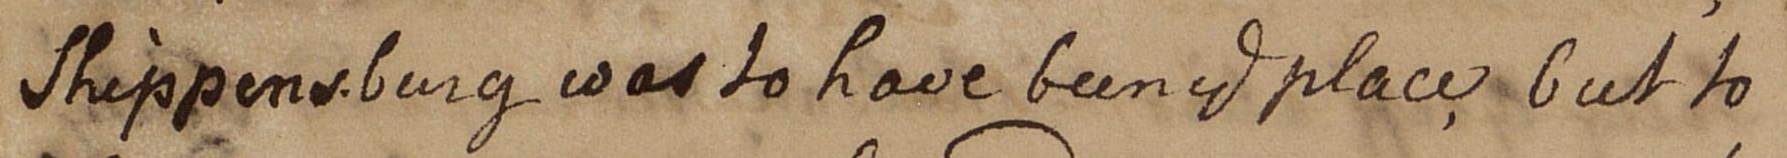Shippensburg was to have been y^e place, but to
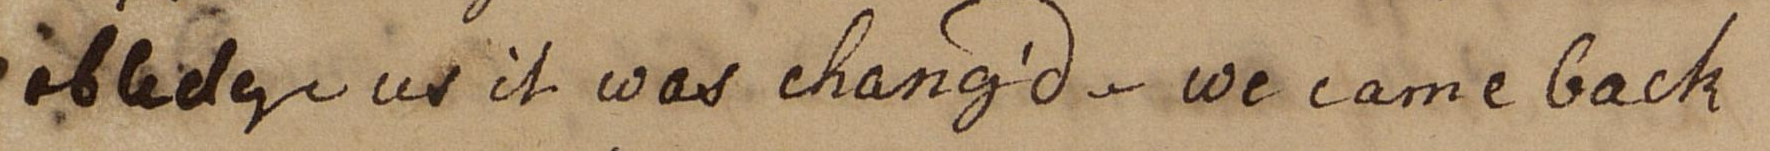oblidge us it was chang'd- we came back
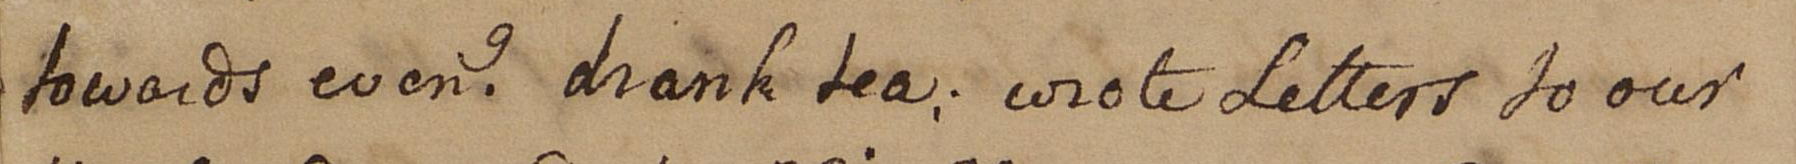towards even^g. drank tea: wrote Letters to our
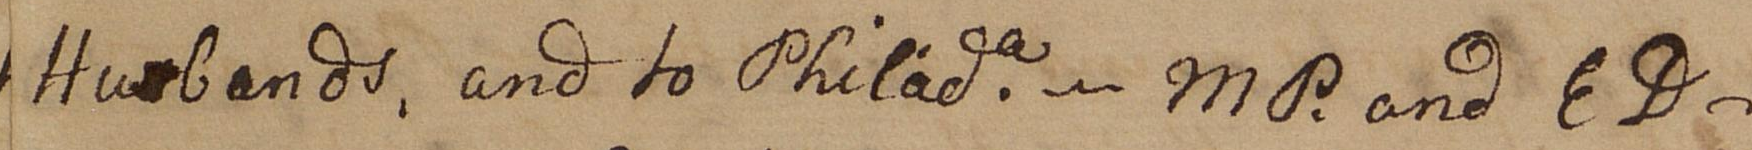Husbands, and to Philad^a.- MP. and E D.
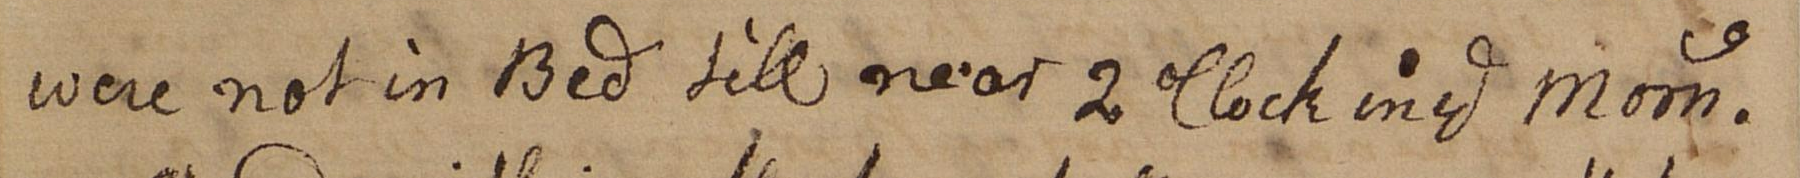were not in Bed till near 2 ^o Clock in y^e morn^g.
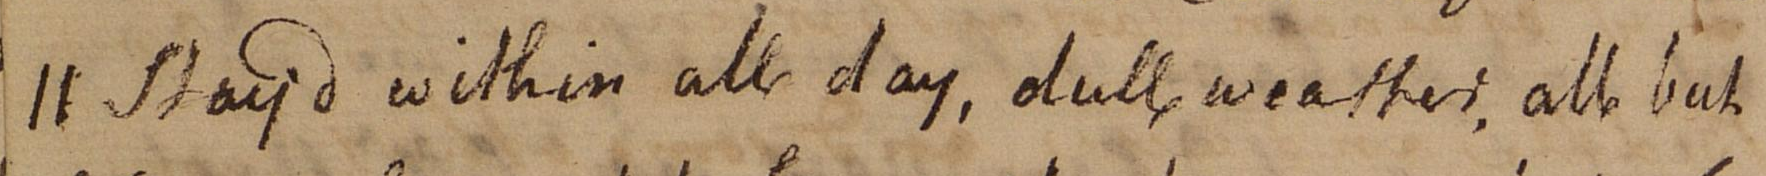11 Stay'd within al day, dull weather, all but
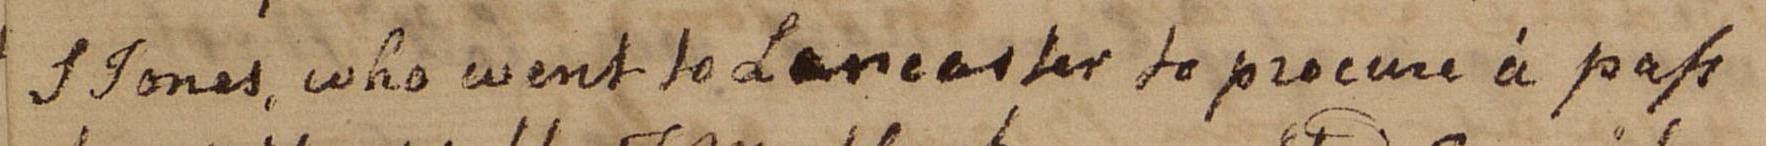S Jones, who went to Lancaster to procure a pass
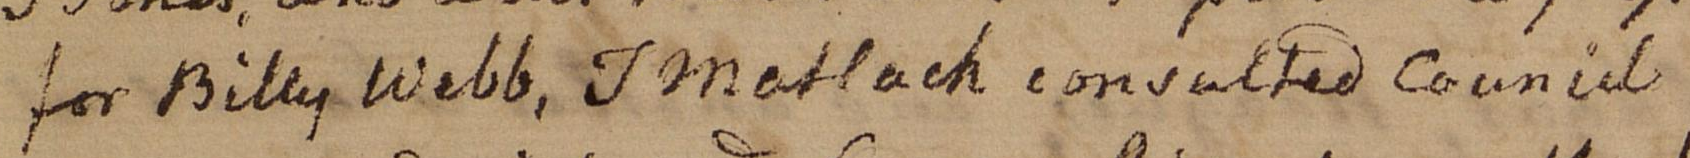for Billy Webb, T Matlack consulted council
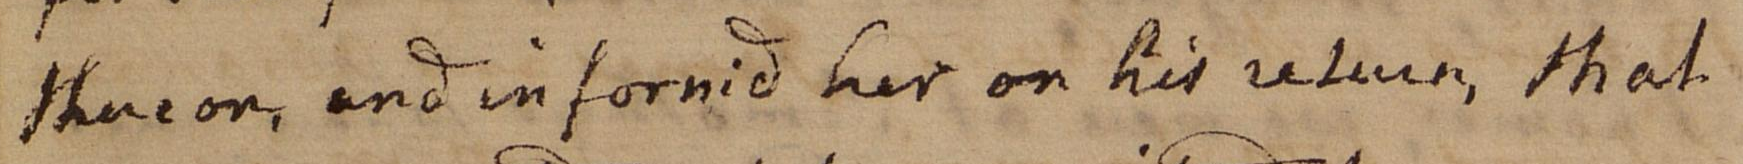thereon, and inform'd her on his return, that
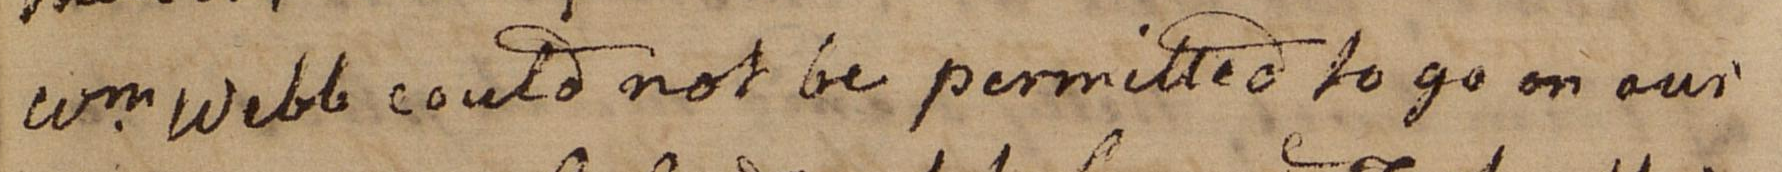W^m. Webb could not be permitted to go on our
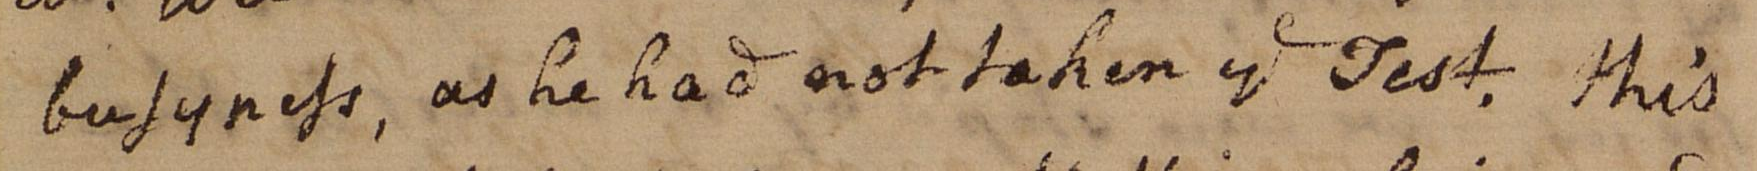busyness, as he had not taken y^e Test, this
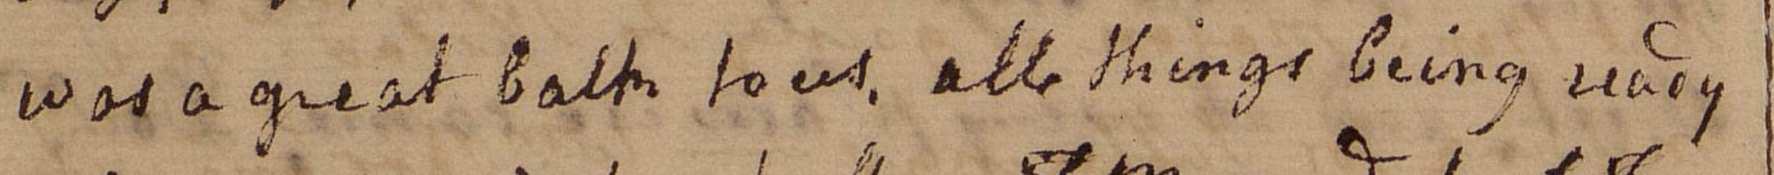was a great balm to us, all things being ready
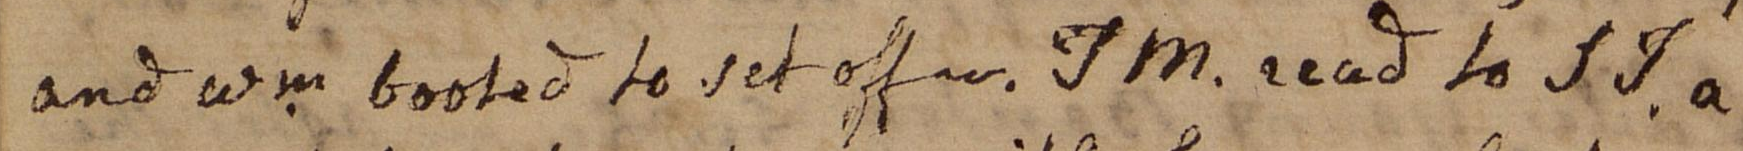and w^m booted to set of- T M. read to SJ. a
